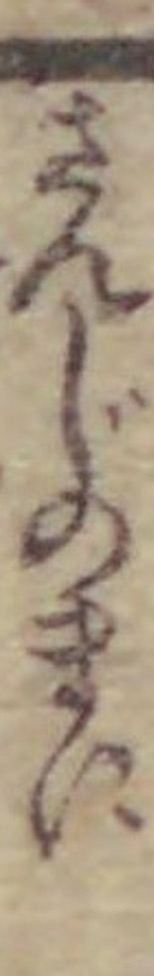さんじのまに
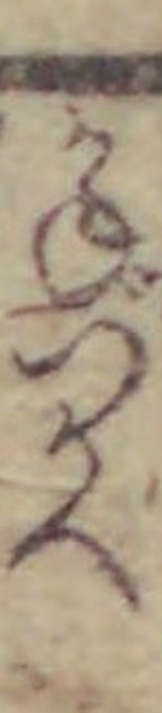かねづかへ
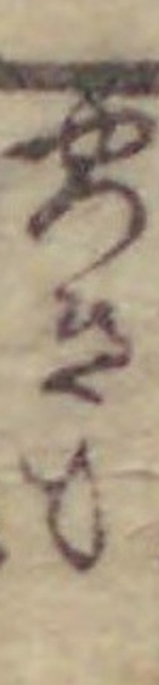やつきも
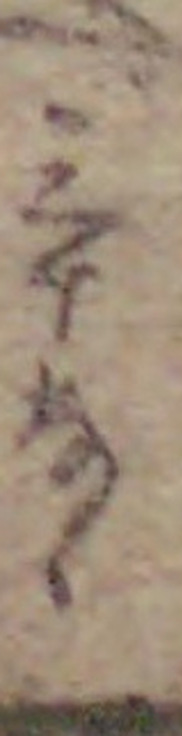三十なゝ
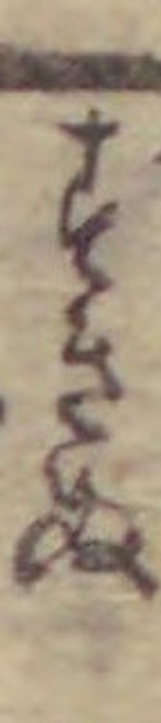すきぬ
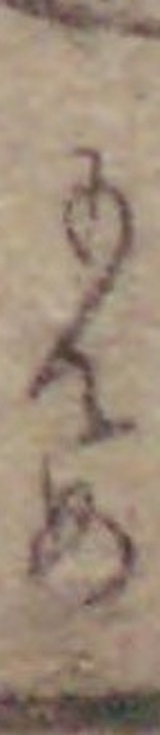もんめ
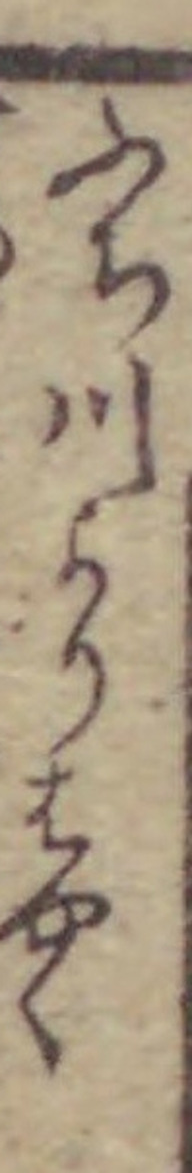ふち川よりはやく
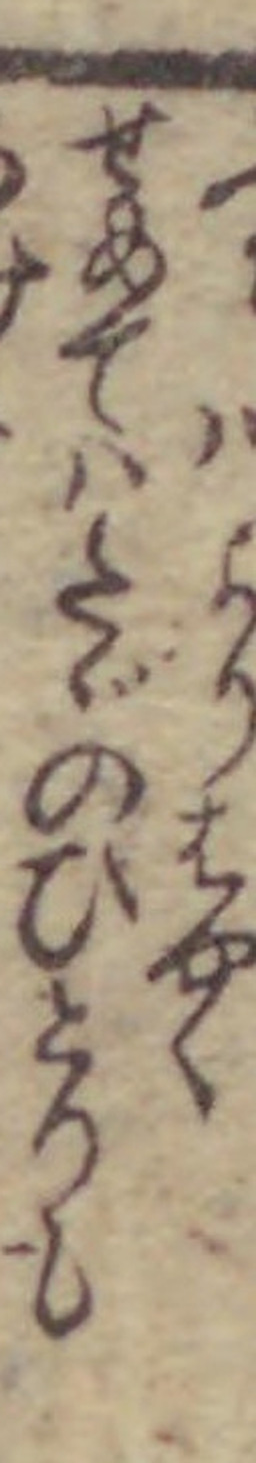せめてはたゞのひとりも
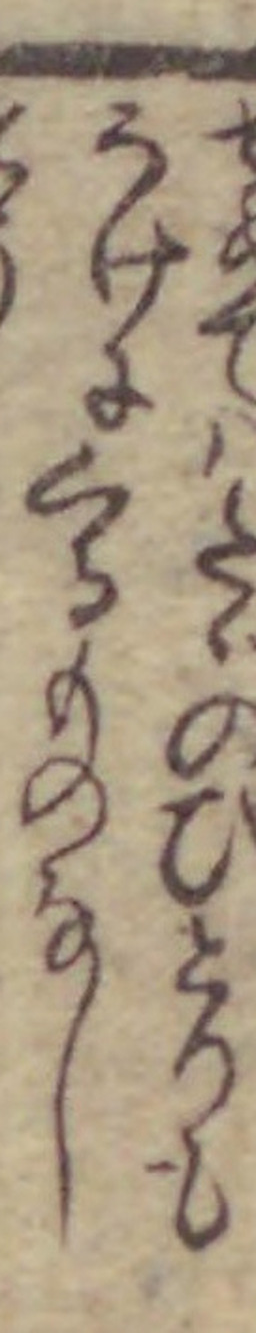うけにくるものなし
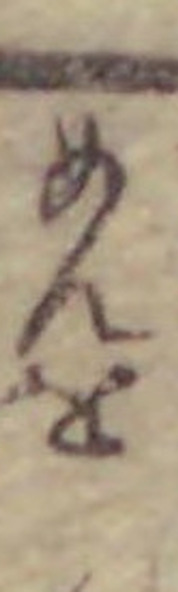めんを
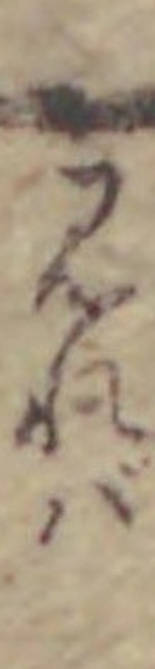見れば
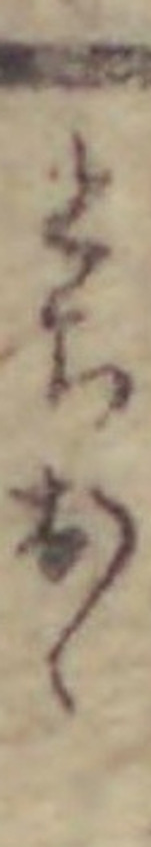とちおく
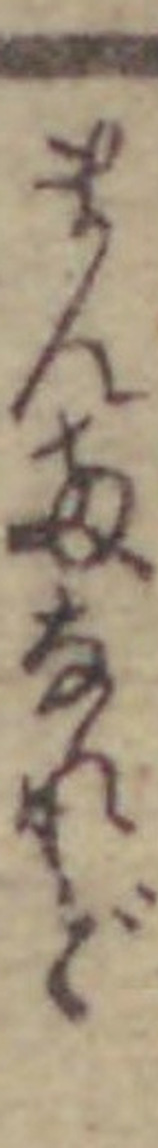まん両なれど
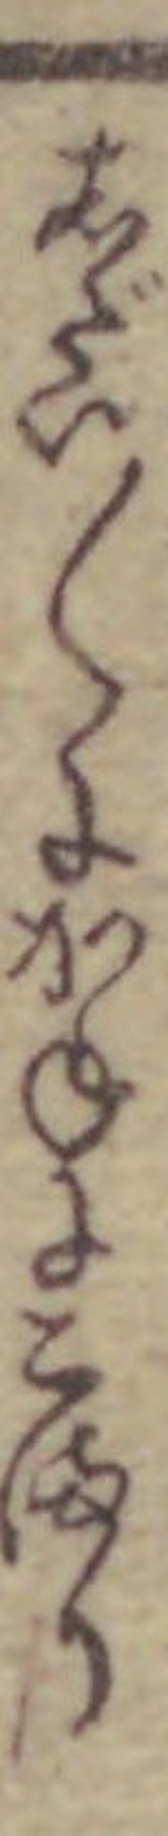しだい〳〵にかねにこまり
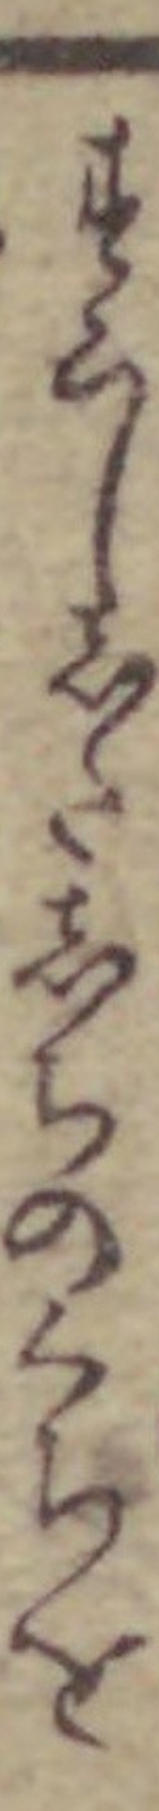すこししたしちのくちを
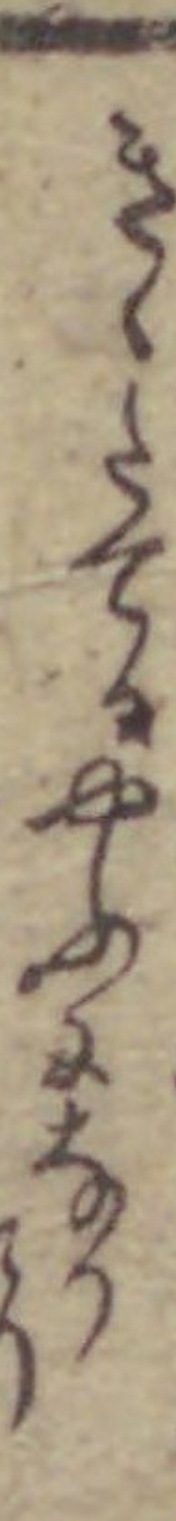きゝたてるやふになり
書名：御代の御寶
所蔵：国立国会図書館 National Diet Library, JAPAN
